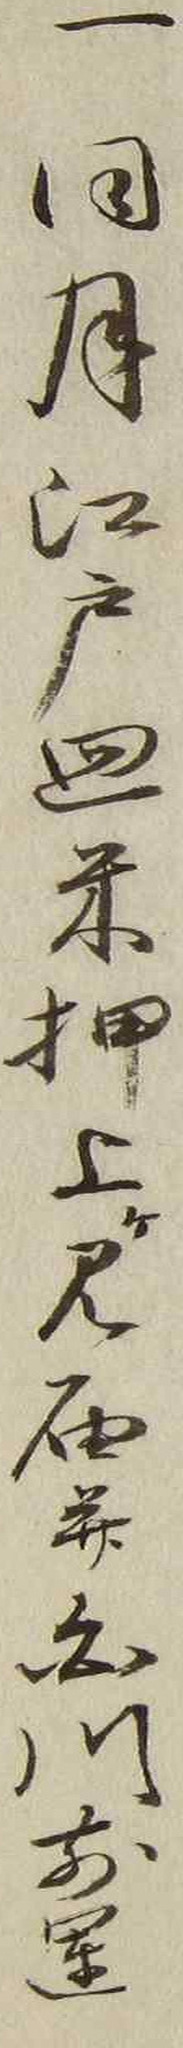一同月江戸廻米押上ヶ見届幷白川前運

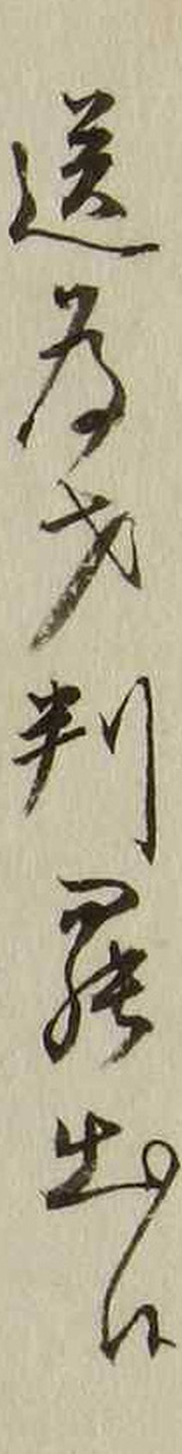送為才判罷出候
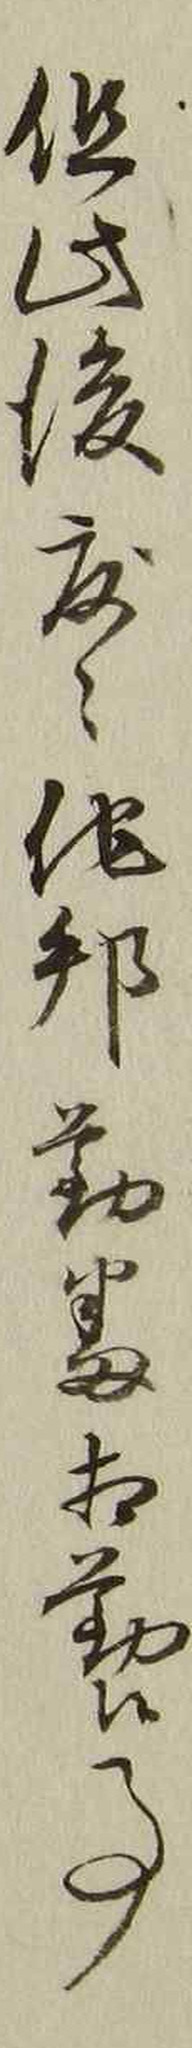但此後度々他部勤番相勤候事
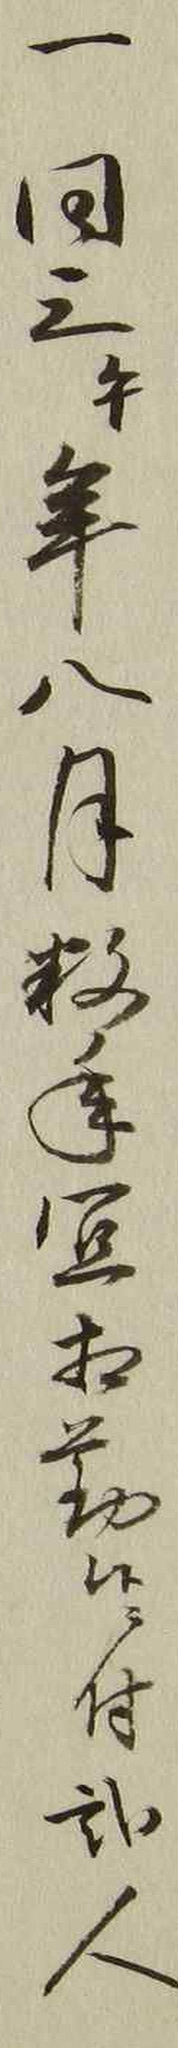一同三午年八月数年冝相勤候ニ付弐人
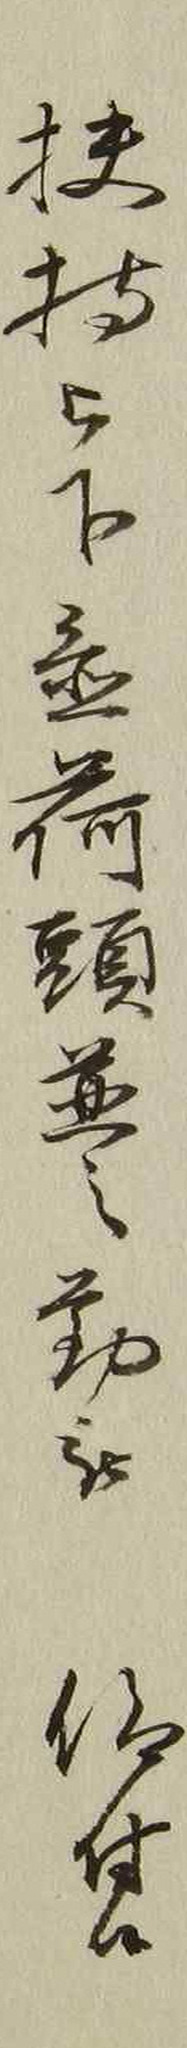扶持被下置荷頭並之勤被仰付候
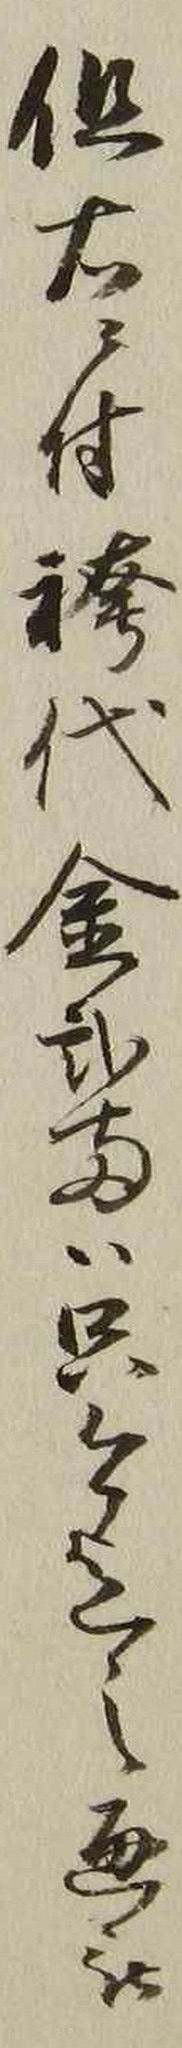但右ニ付袴代金弐両ハ只今迄之通被
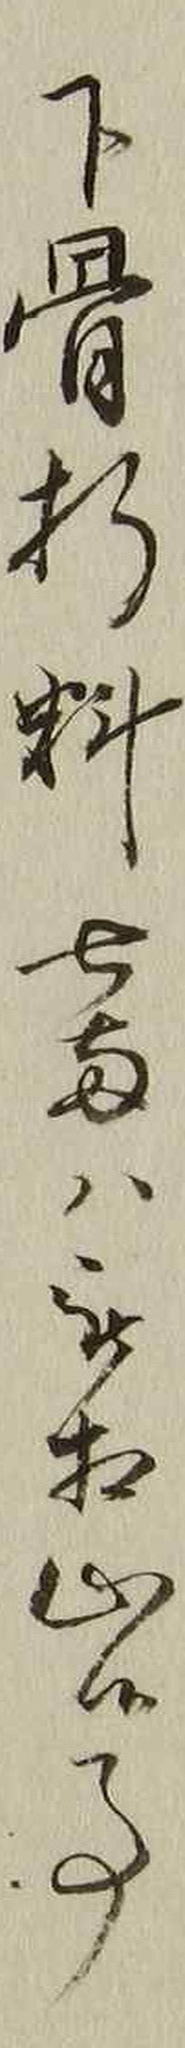下骨折料七両ハ被相止候事
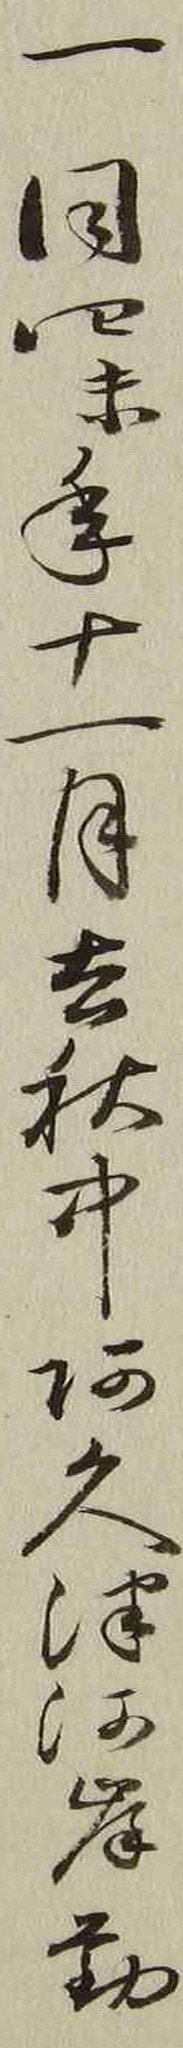一同四未年十一月去秋中阿久津河岸勤
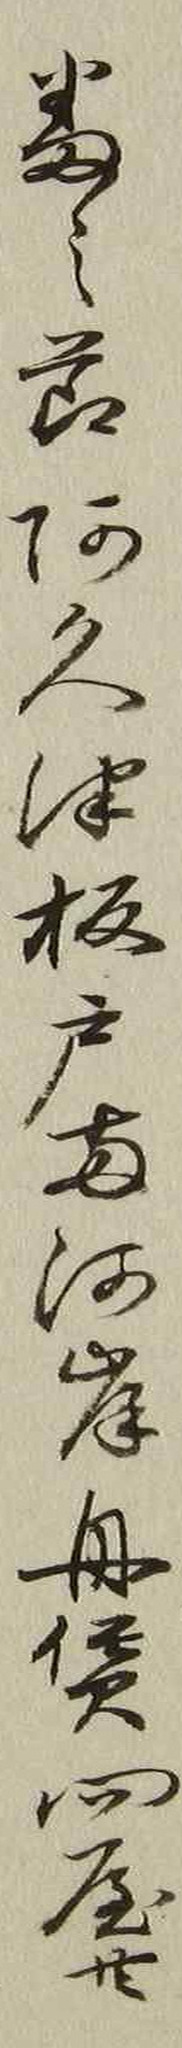番之節阿久津板戸両河岸舟賃問屋共
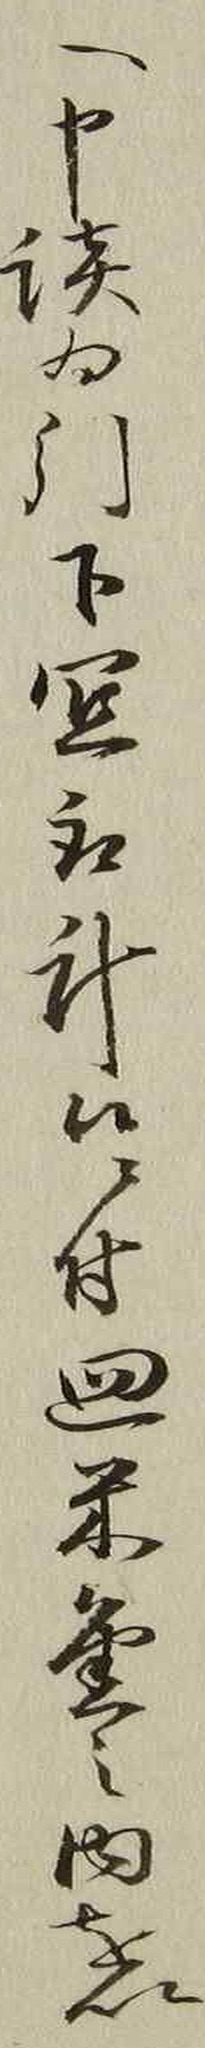へ申談ゐ引下宜取計候二付廻米金之内を以
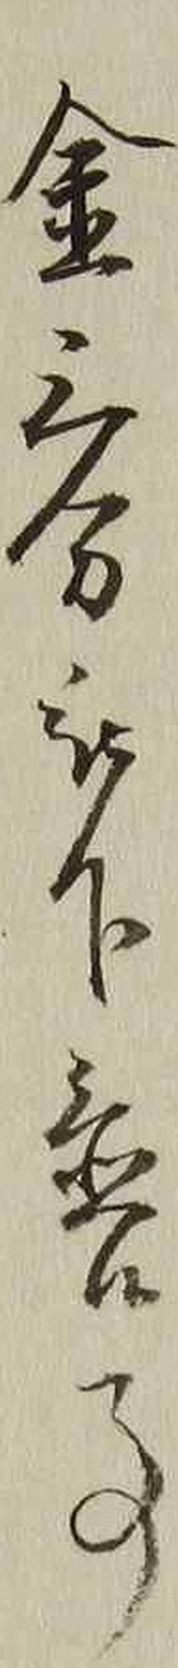金三分被下置候事
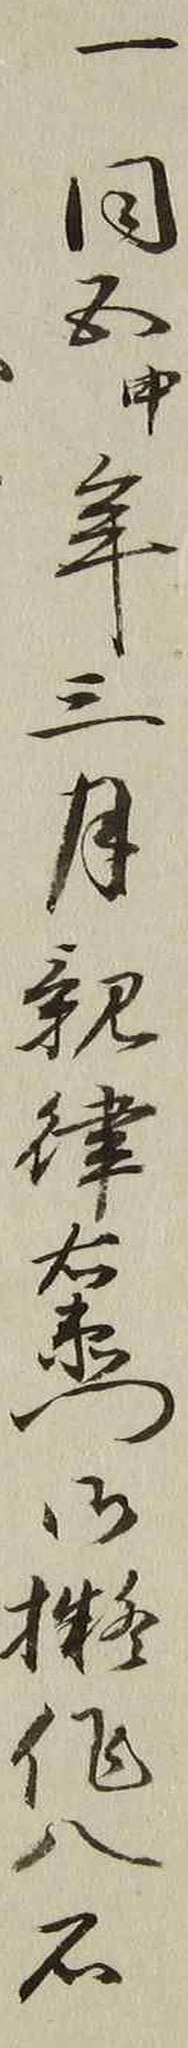一同五申年三月親律右衛門御擬作八石
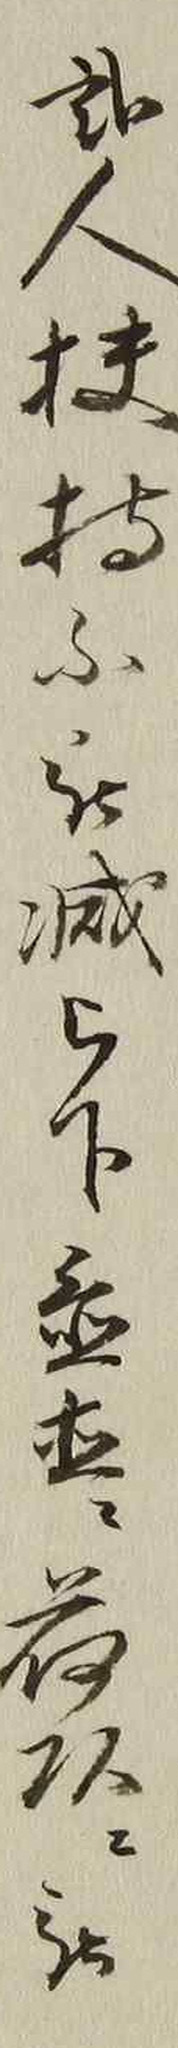弐人扶持ふ被減被下置直ニ荷頭ニ被
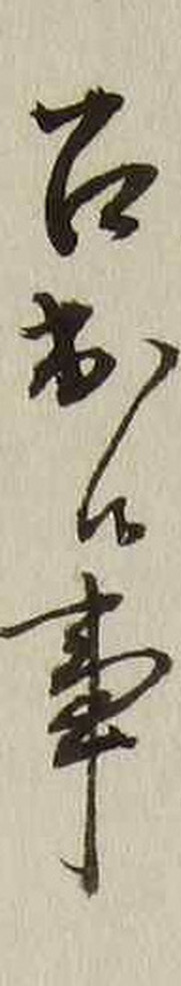召出候事
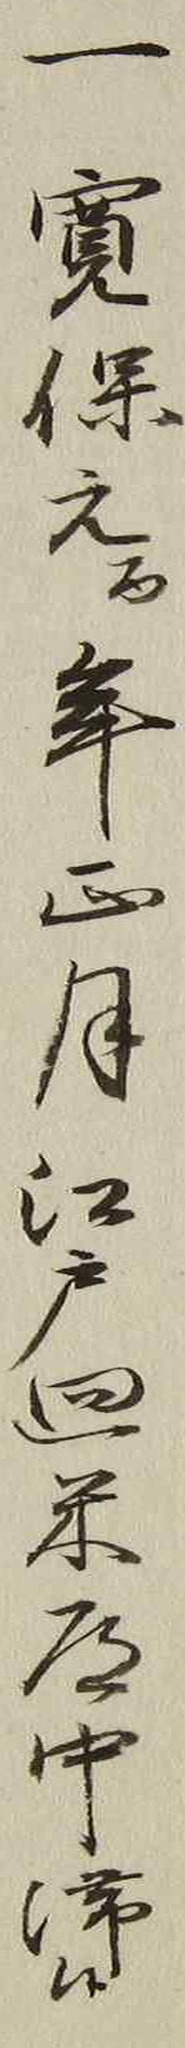一寛保元酉年正月江戸廻米道中滞候
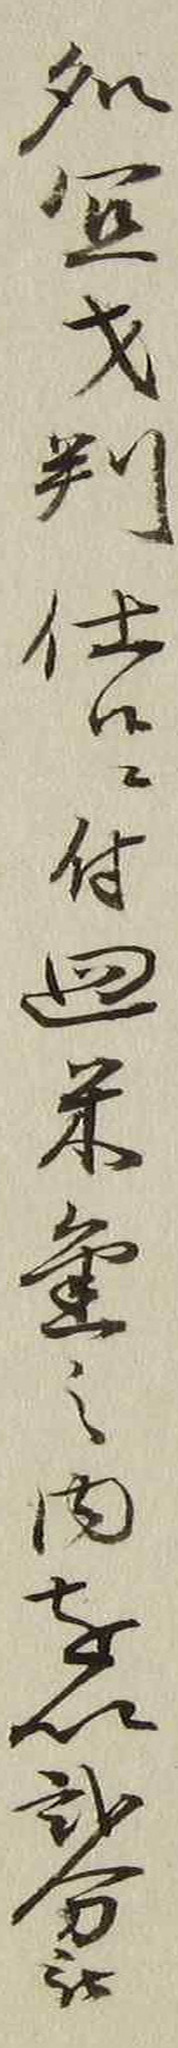処宣才判仕候ニ付廻米金之内を以弐分被
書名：諸士系譜　巻之114　か之部22
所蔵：会津若松市立会津図書館
